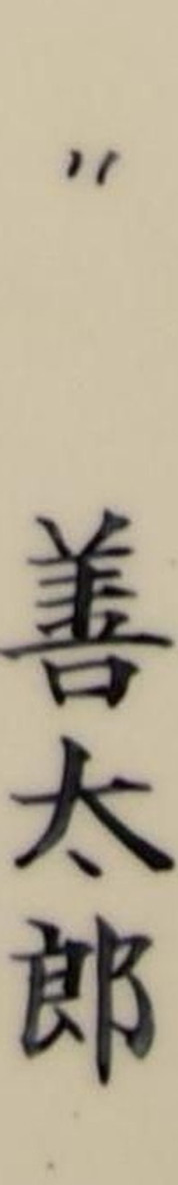善太郎
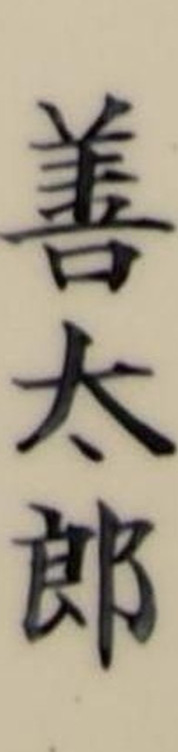善太郎
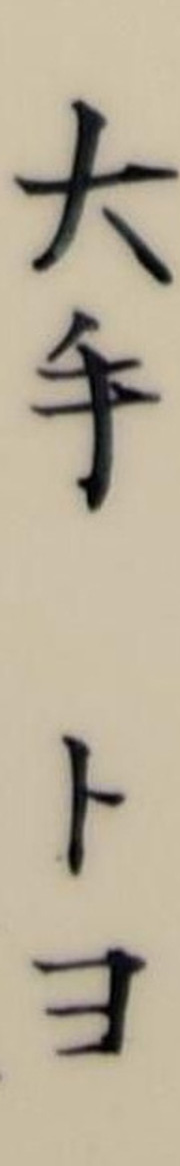大手トヨ
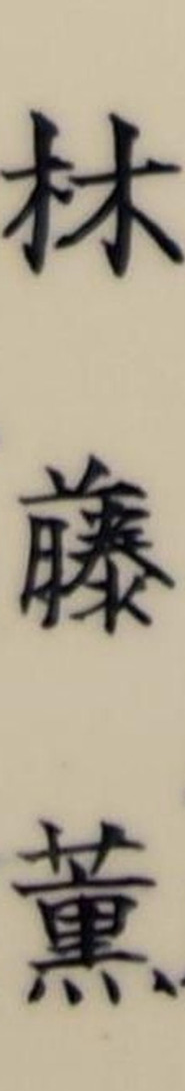林藤薫
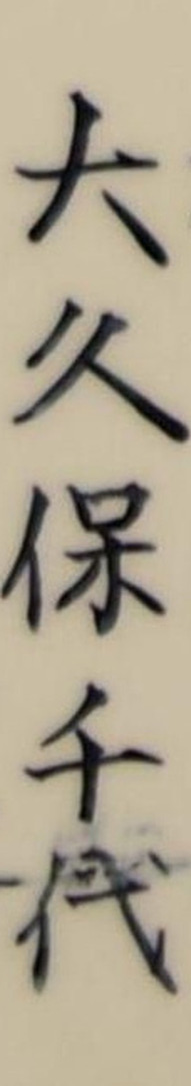大久保千代
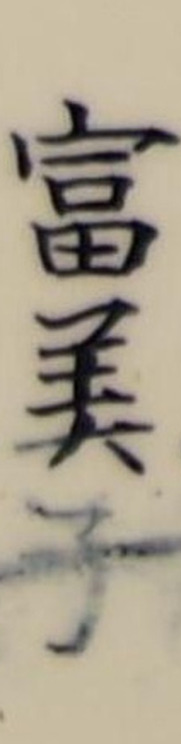富美子
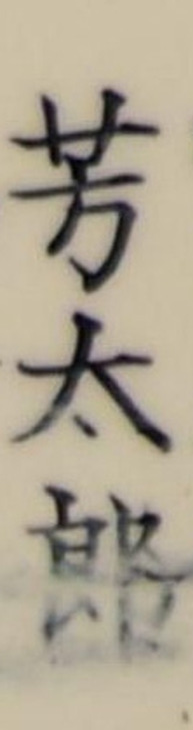芳太郎
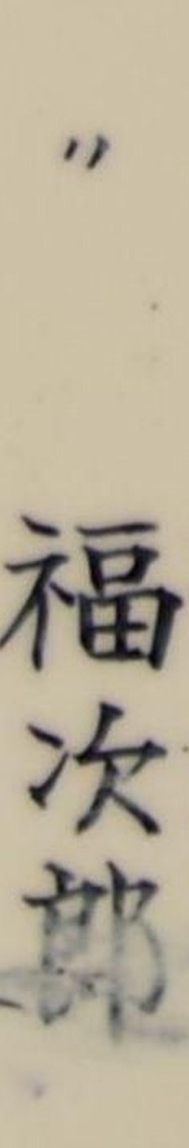福次郎
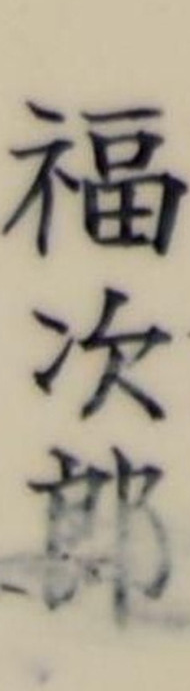福次郎
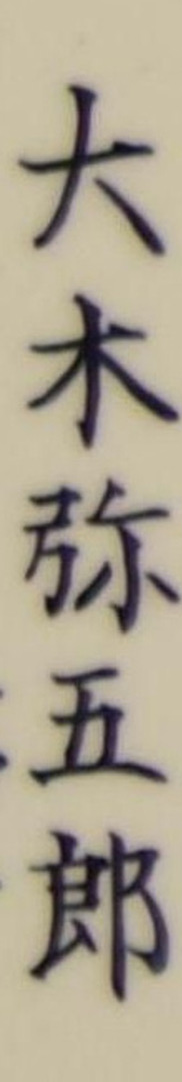大木弥五郎

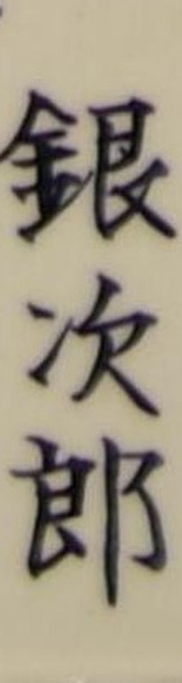銀次郎
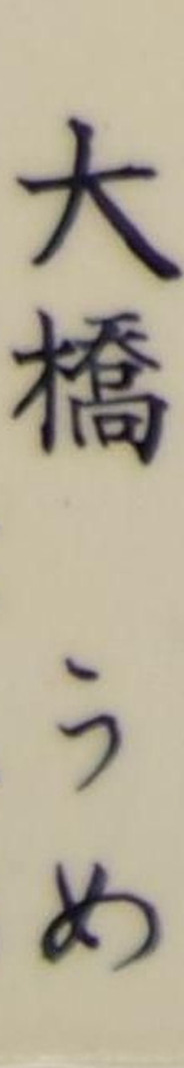大橋うめ
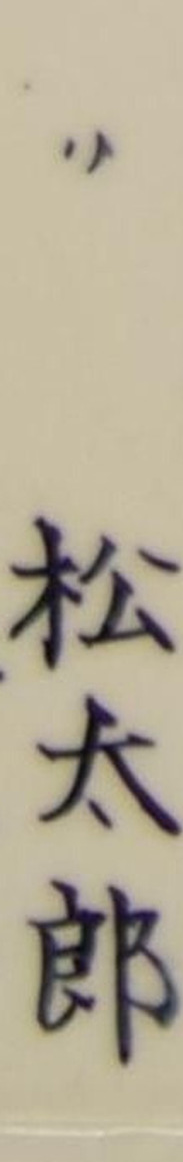松太郎
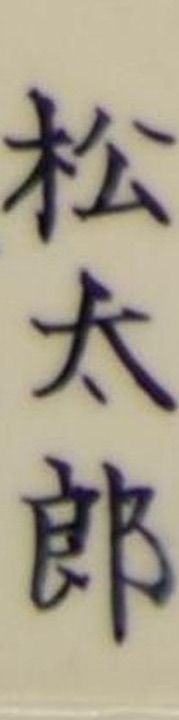松太郎
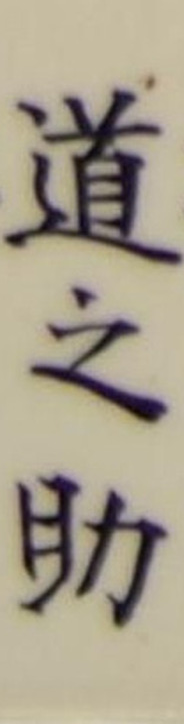道之助
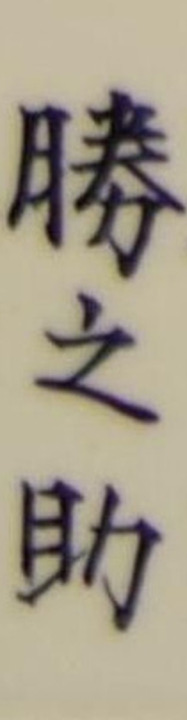勝之助
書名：A~D
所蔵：koyasan kongobuji
